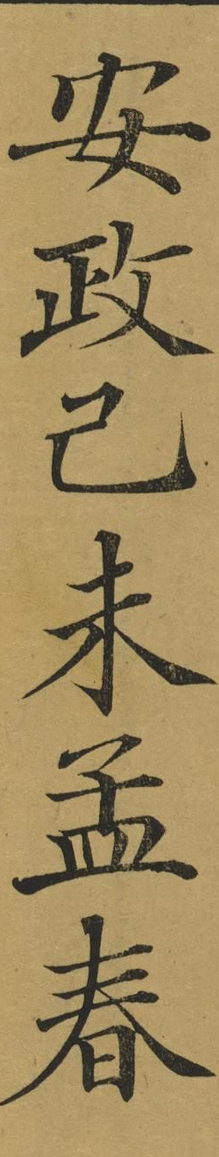安政己未孟春
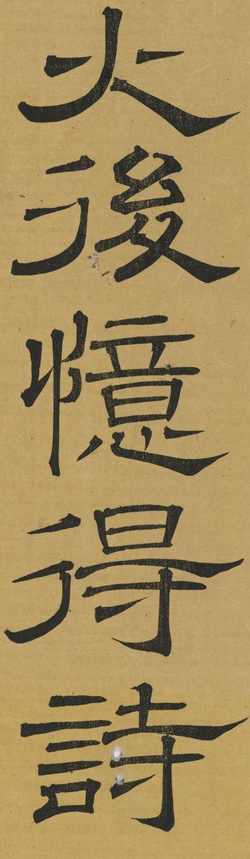火後憶得詩
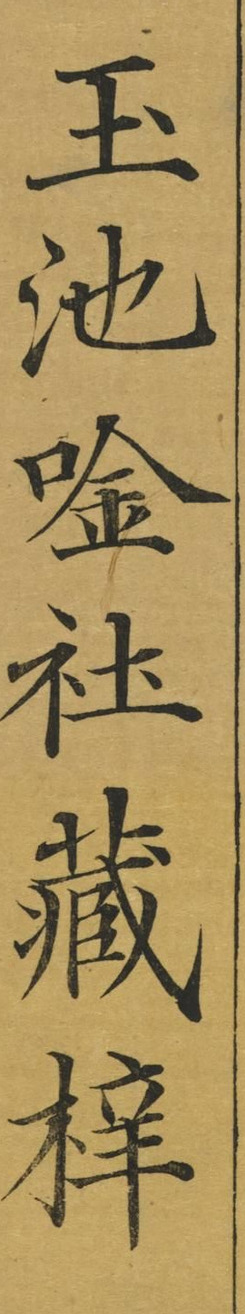玉池唫社蔵梓

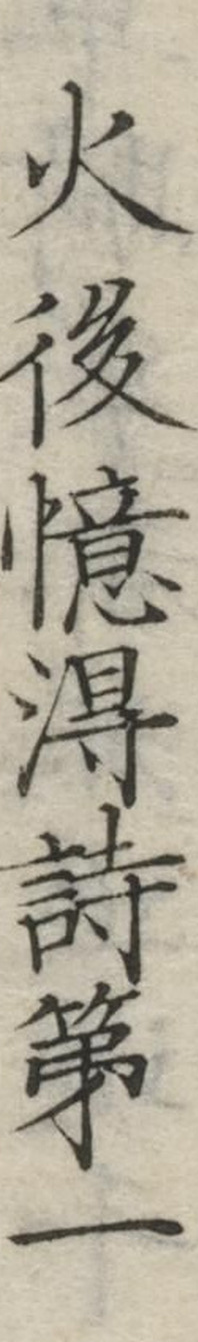火後憶得詩第一
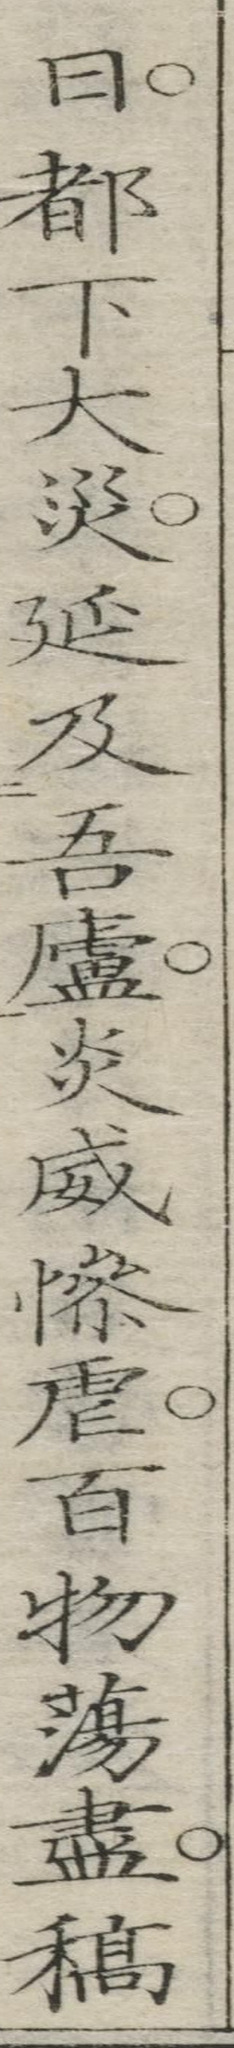日都下大災延及吾盧炎威惨虐百物蕩尽稿
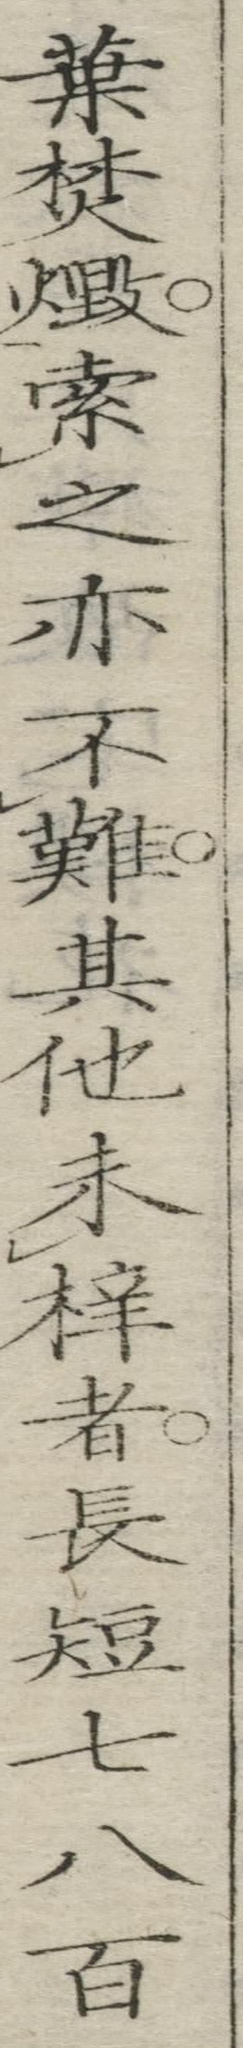葉焚燬索之亦不難其他未梓者長短七八百
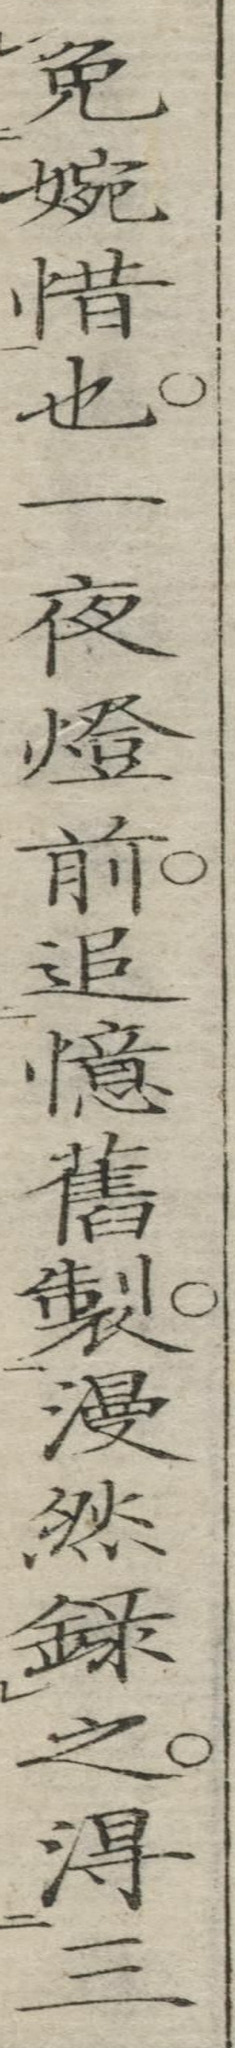免婉惜也一夜燈前追憶旧製漫然録之得三
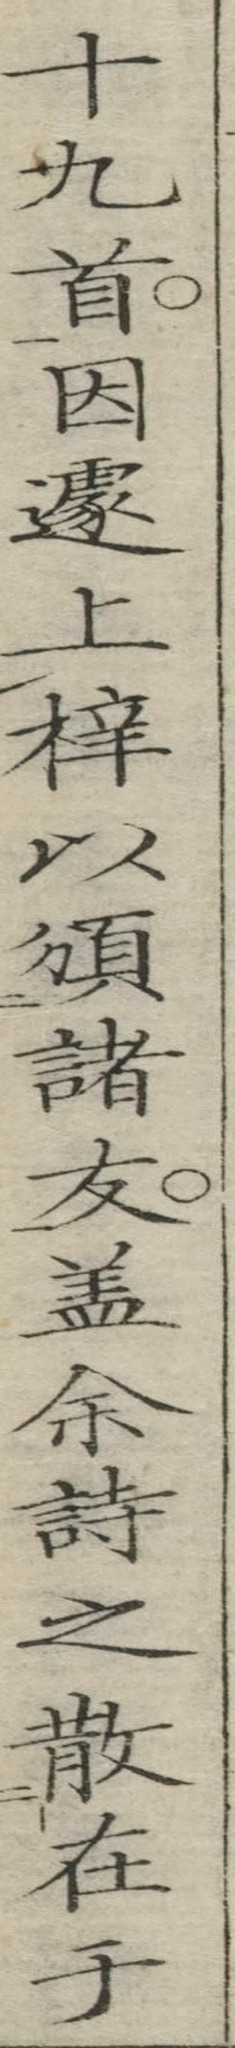十九首因遽上梓以頒諸友蓋余詩之散-在于

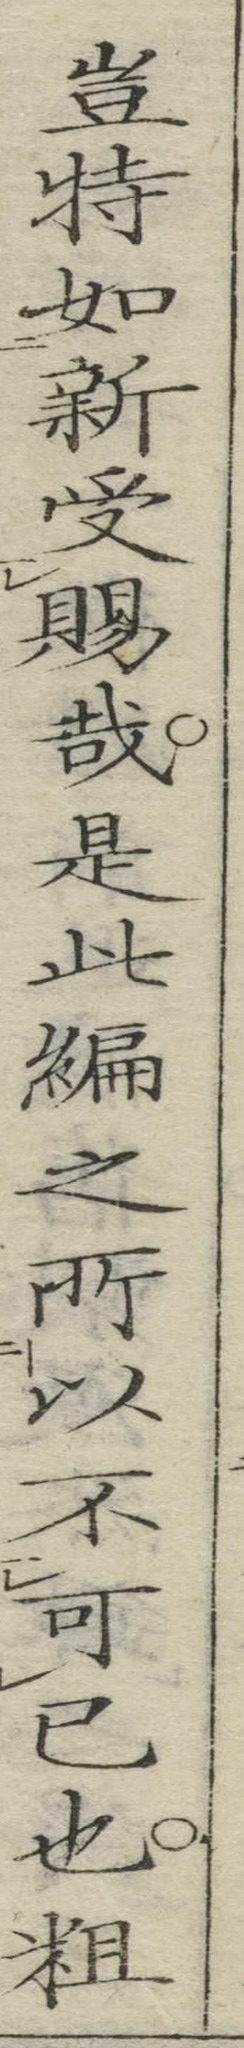豈特如新受レ賜哉是此編之所-以不レ可已也粗
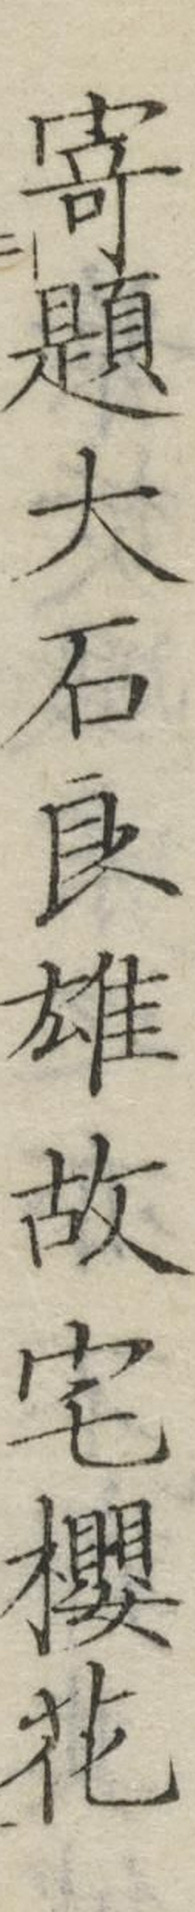寄-題大石良雄故宅桜花
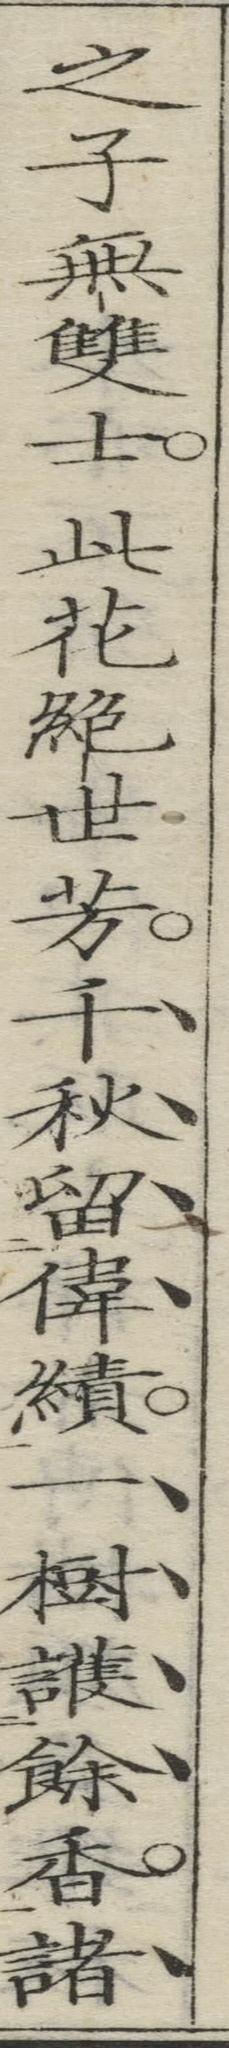之子無-双士此花絶-世芳千秋留偉績一樹護餘香諸
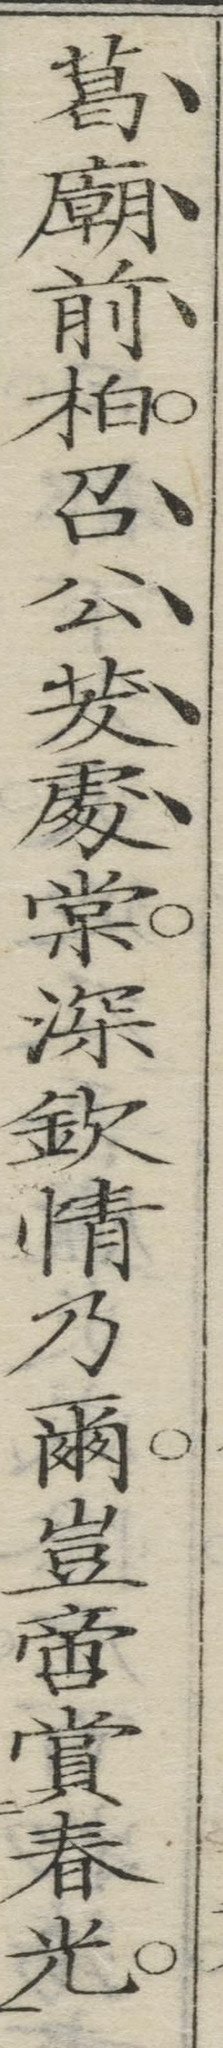葛廟前柏召公茇処棠深欽情乃爾豈啻賞春光
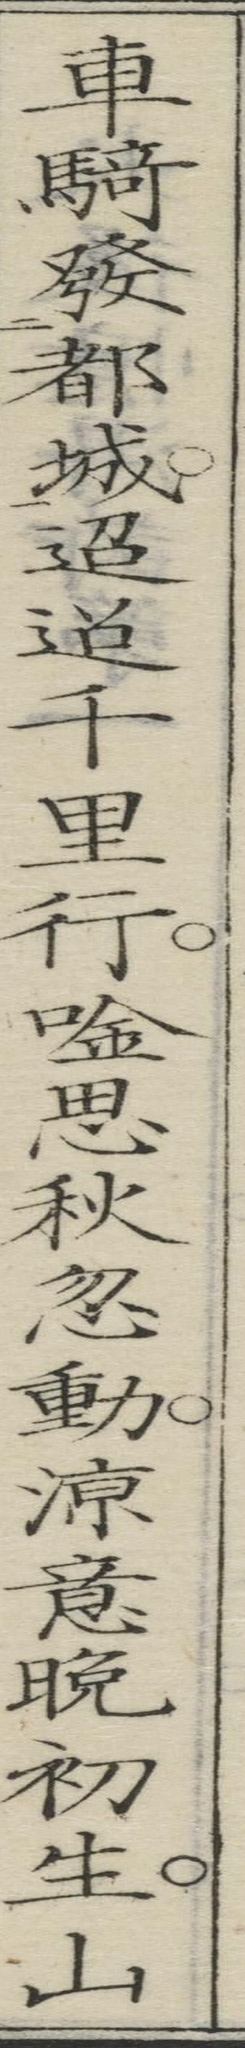車騎発都城迢迢千里行唫思秋忽動涼意晩初生山
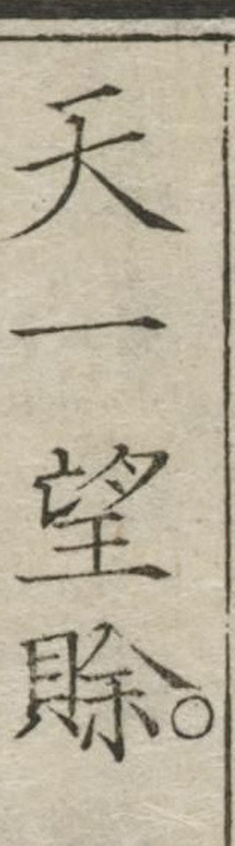天一望賖
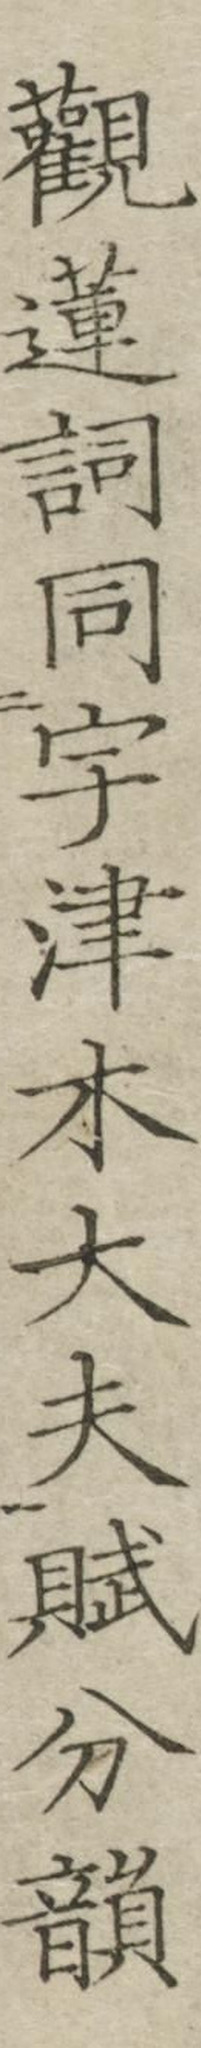観蓮詞同宇津木大夫賦分韻
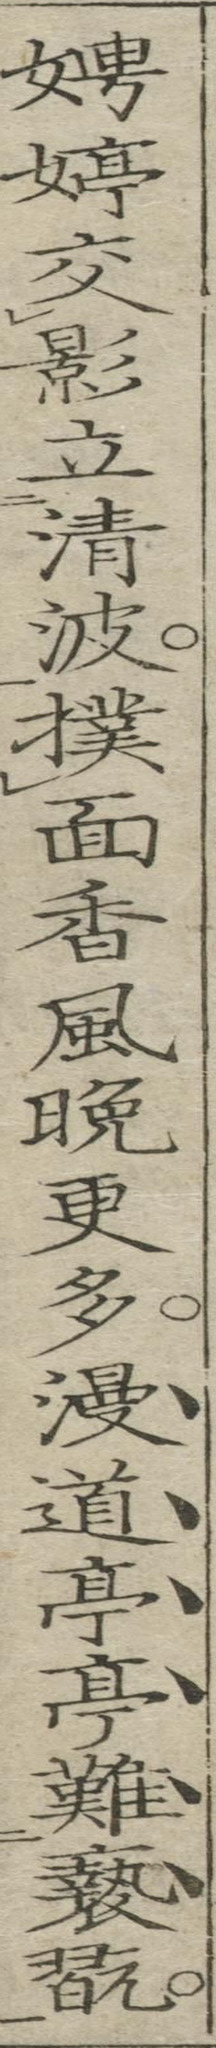娉婷交影立清波撲面香風晩更多漫道亭亭難褻翫
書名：火後憶得詩
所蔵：東京大学地震研究所図書室 Earthquake Research Institute Library, The University of Tokyo, JAPAN
